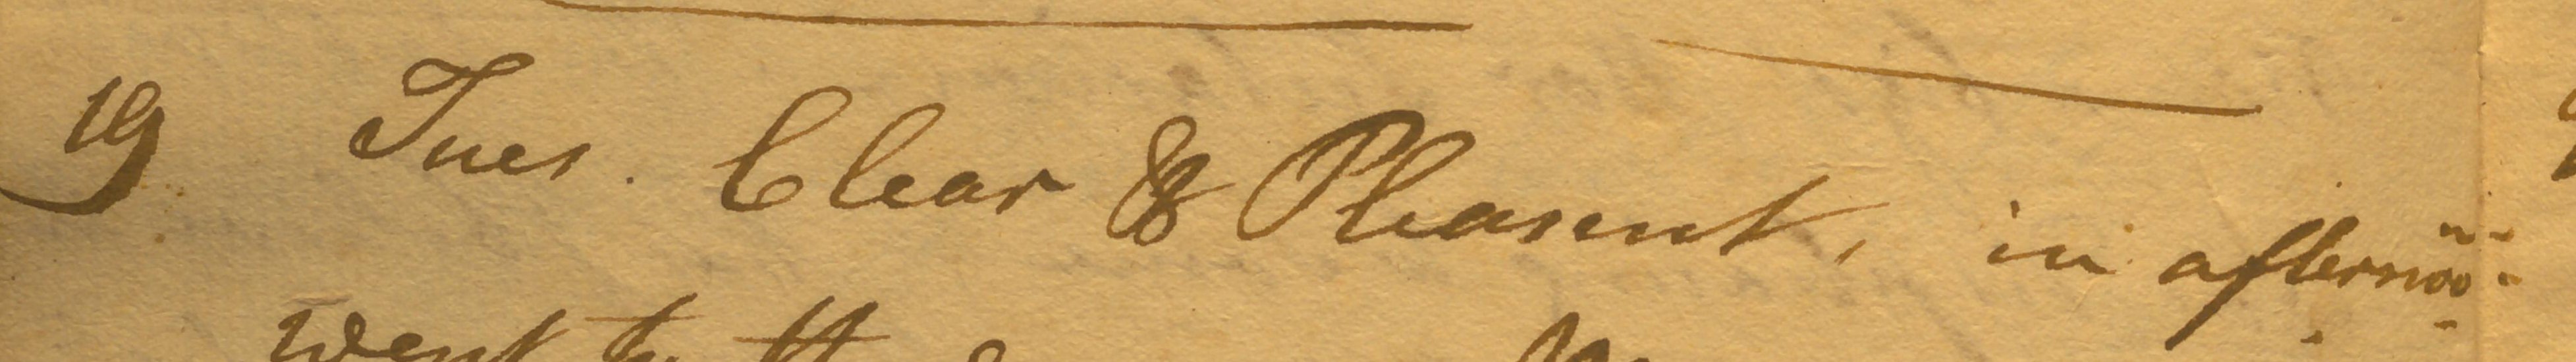19 Tues. Clear & Pleasent, in afternoo^n.
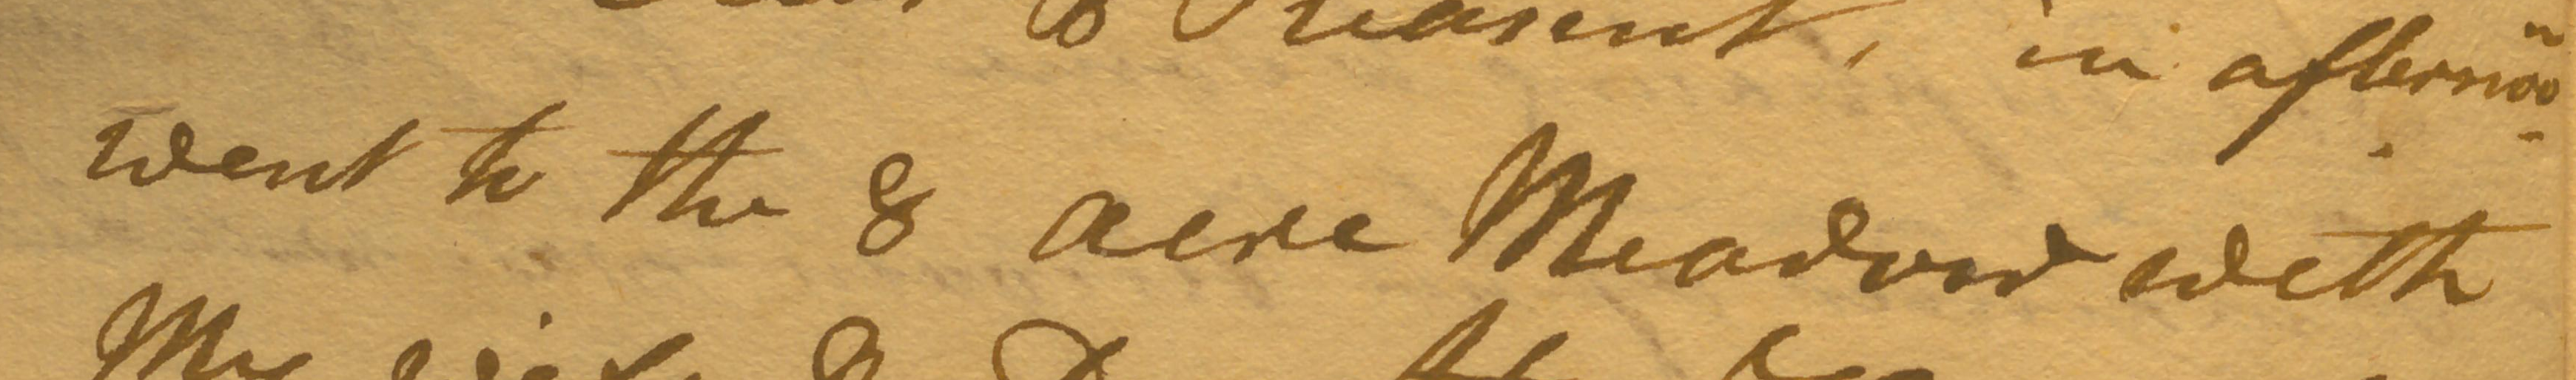went to the 8 acre Meadow with
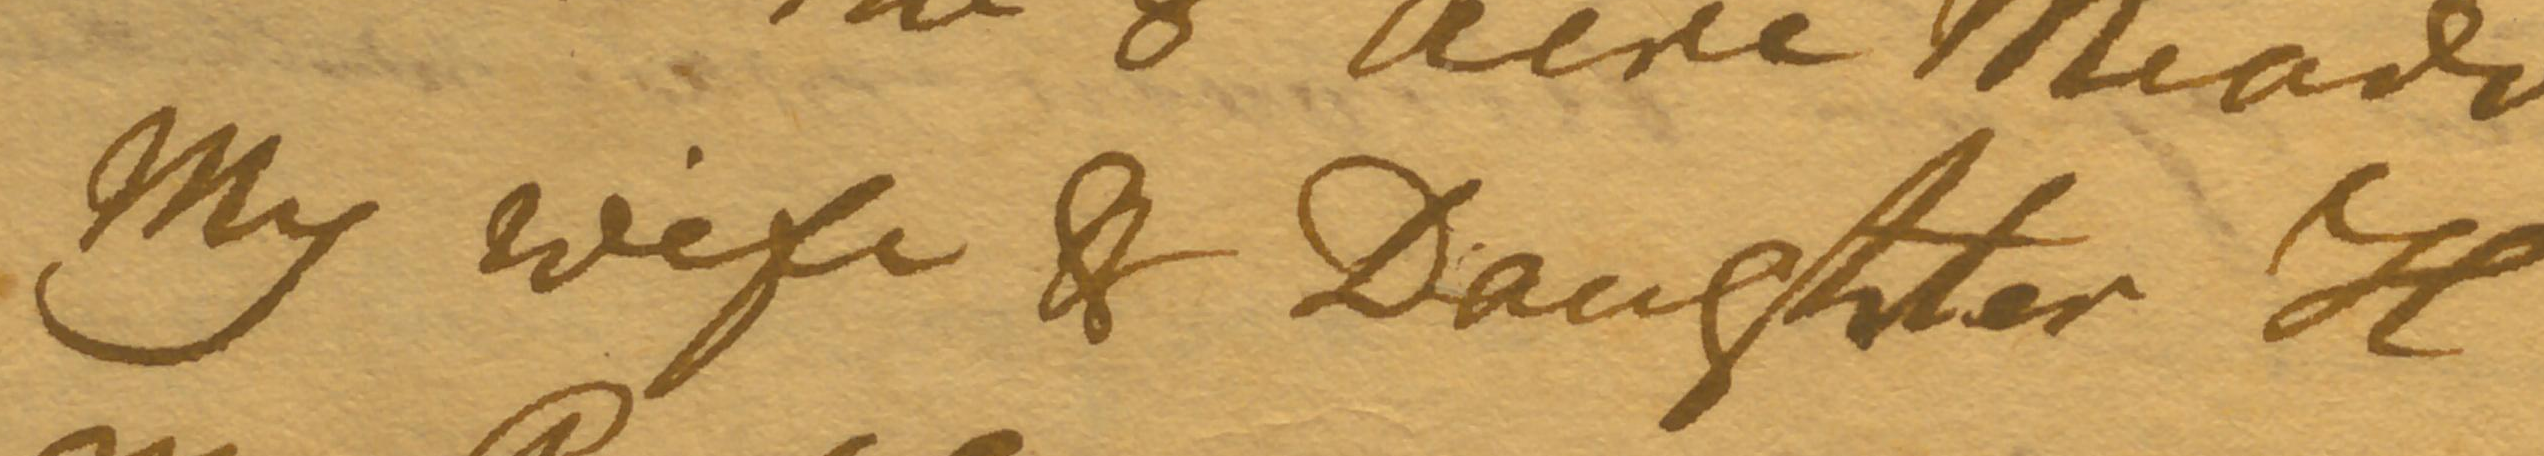My wife & Daughter H
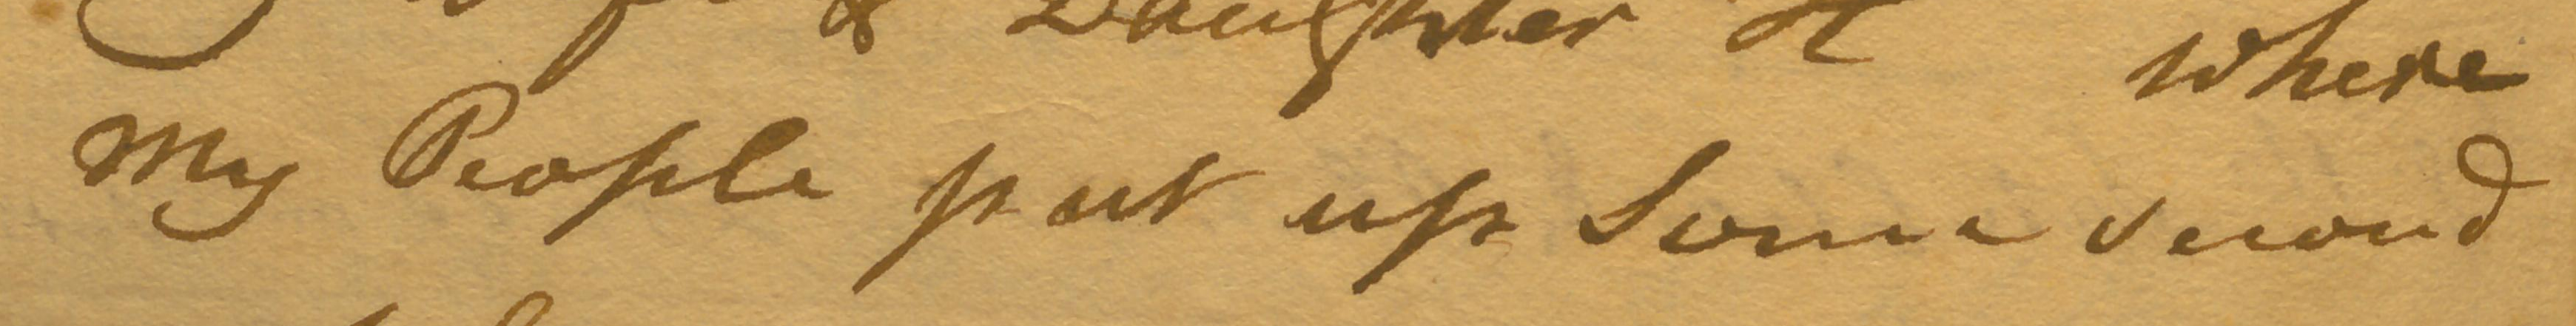My People put up some second
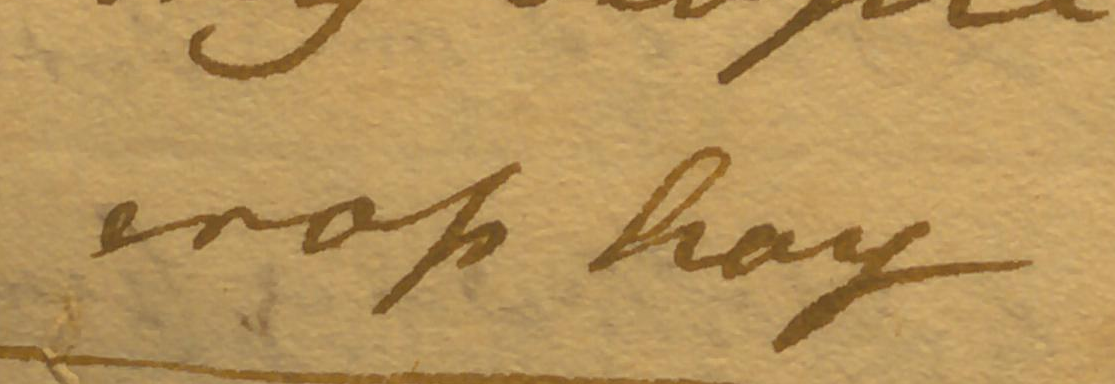crop hay
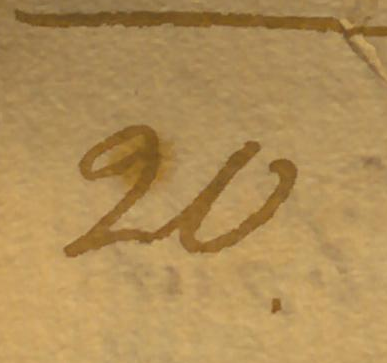20
